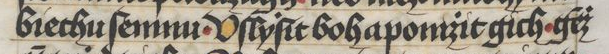bíechu ſemnu.Vſlyẛit boh a poníżit gich.gēż
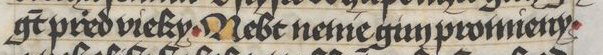ḡt před vieky.Nebt nenie gim promieny.
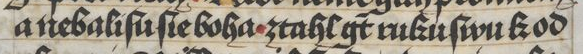a nebaliſu ſie boha.ztahl ḡt ruku ſwu k od
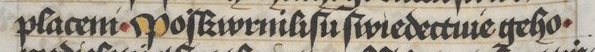placení.Poẛkwrniliſu ſwiedectuíe geho.
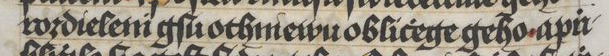rozdieleni gſu othniewu obliċege geho.a pṙi¬
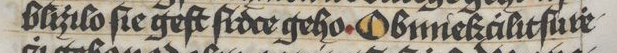blíżilo ſie geſt ſrdce geho.Obmiekċilitſu ṙe¬
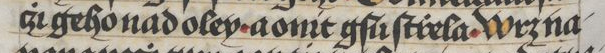cżi geho nad oley.a onít gſu ſtṙela.Wrz na¬
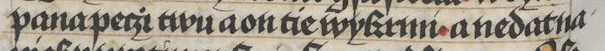pana pecżi twu a on tie wykrmí.a nedat na¬
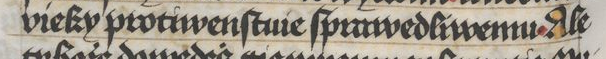vieky protiwenſtuie ſprawedliwemu.Ale
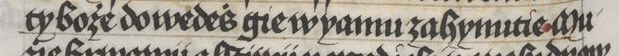ty boże dowedeṡ gie w yamu zahynutie.Mu¬
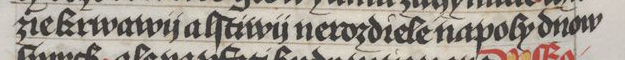żie krwawij a lſtiwij nerozdiele napoly dnow
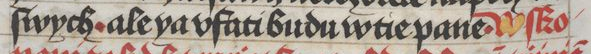ſwych.ale ya vſati budu w tie pane.W ſko¬
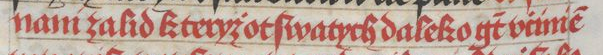naní zalid kteryż ot ſwatych daleko ḡt vċíníē
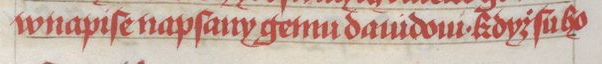wnapiſe napſany gemu dauidoui.když ſu ho
